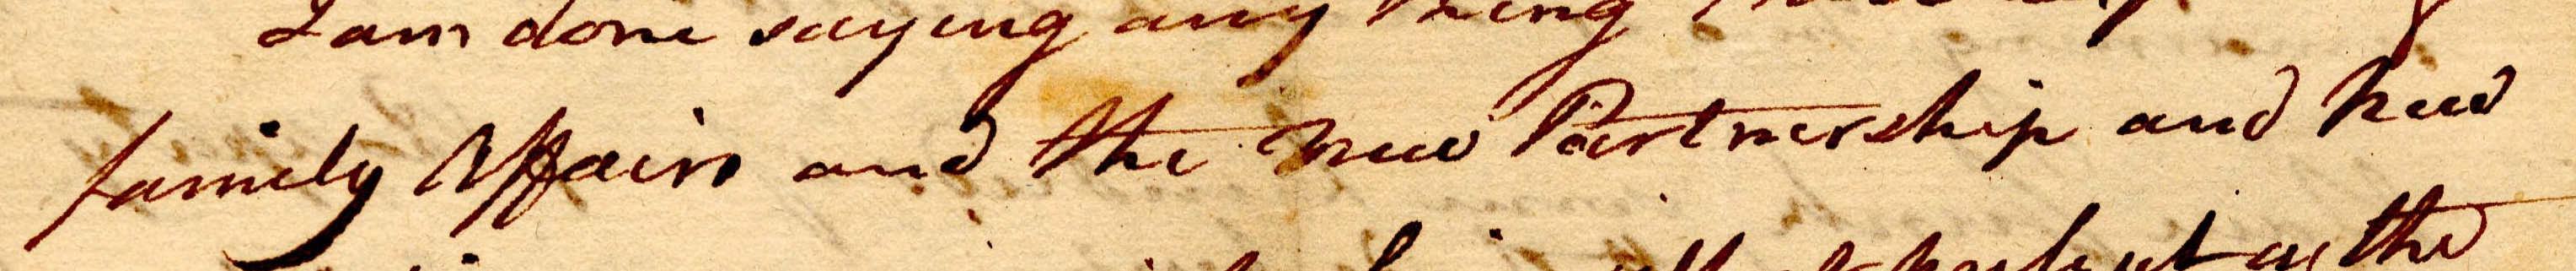family Affairs and the new Partnership and need
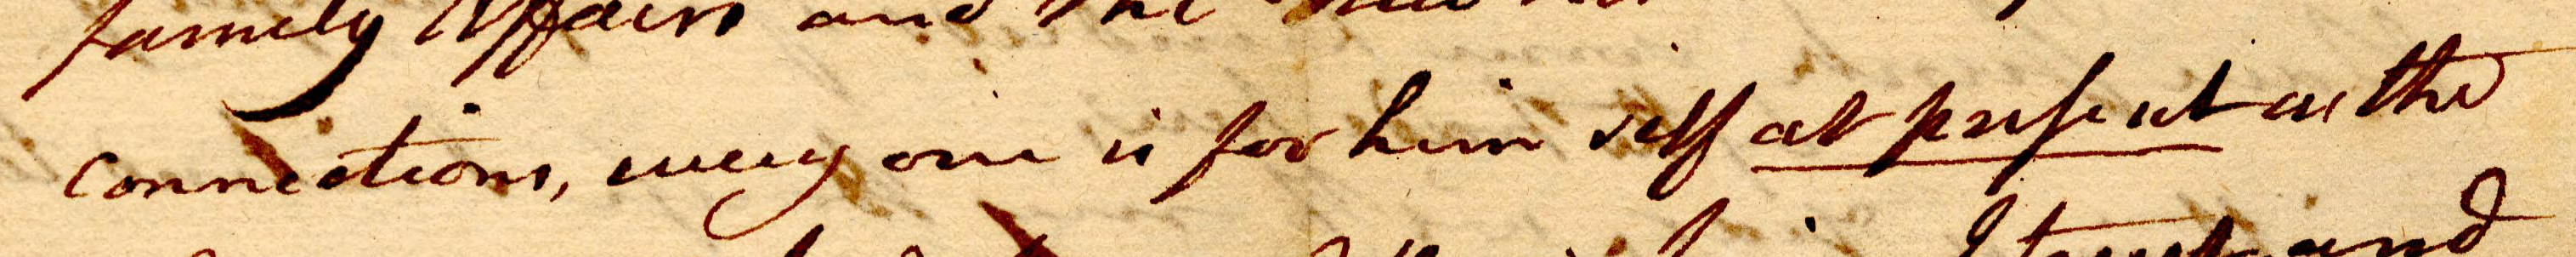connections, every one is for him self at present as the
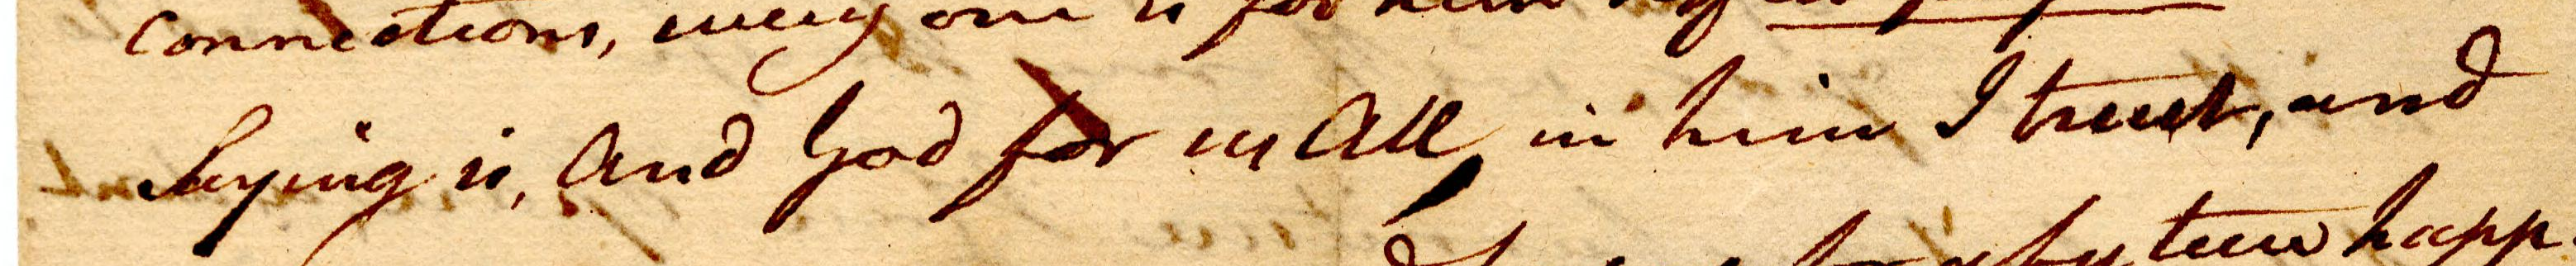saying is, and God for us All, in him I trust, and
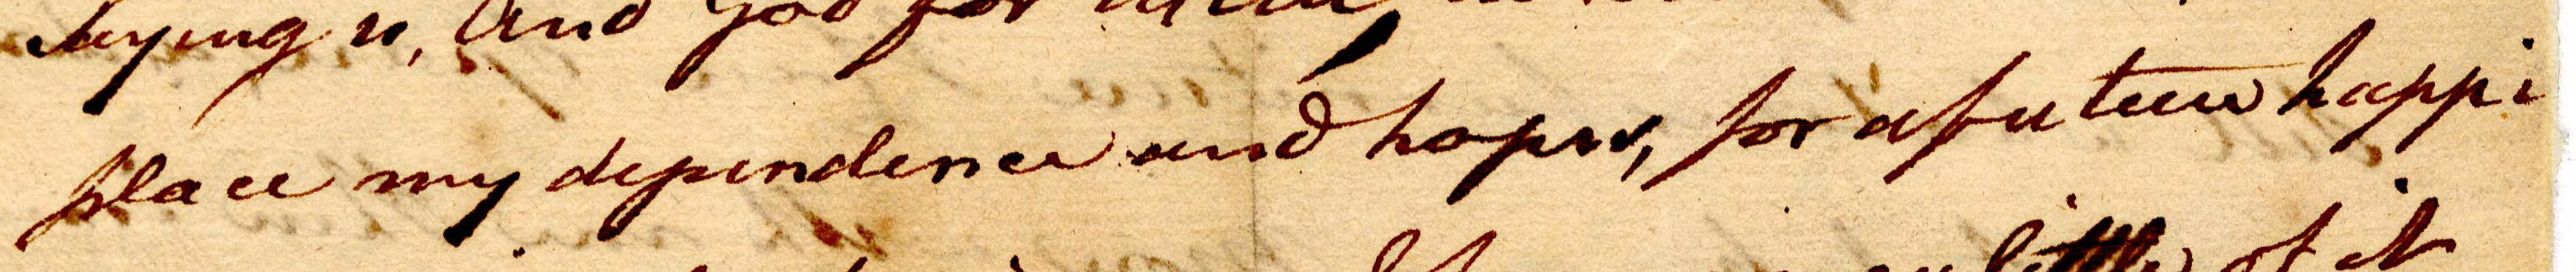place my dependence and hopes, for a future happi-
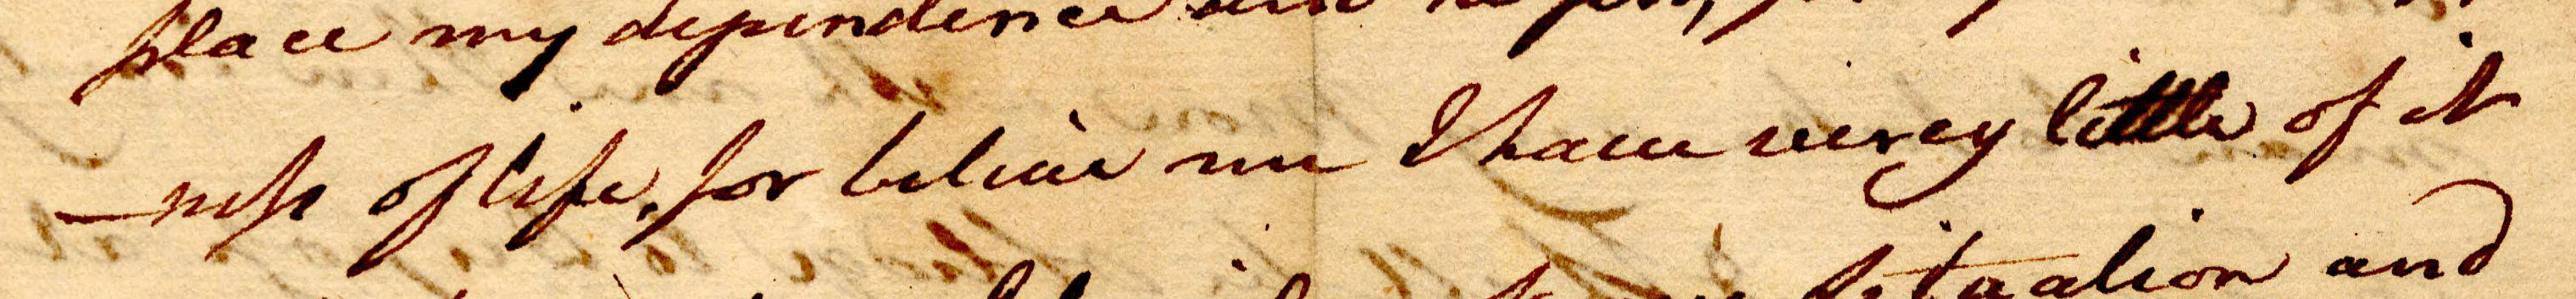-ness of life for believe me I have very little of it
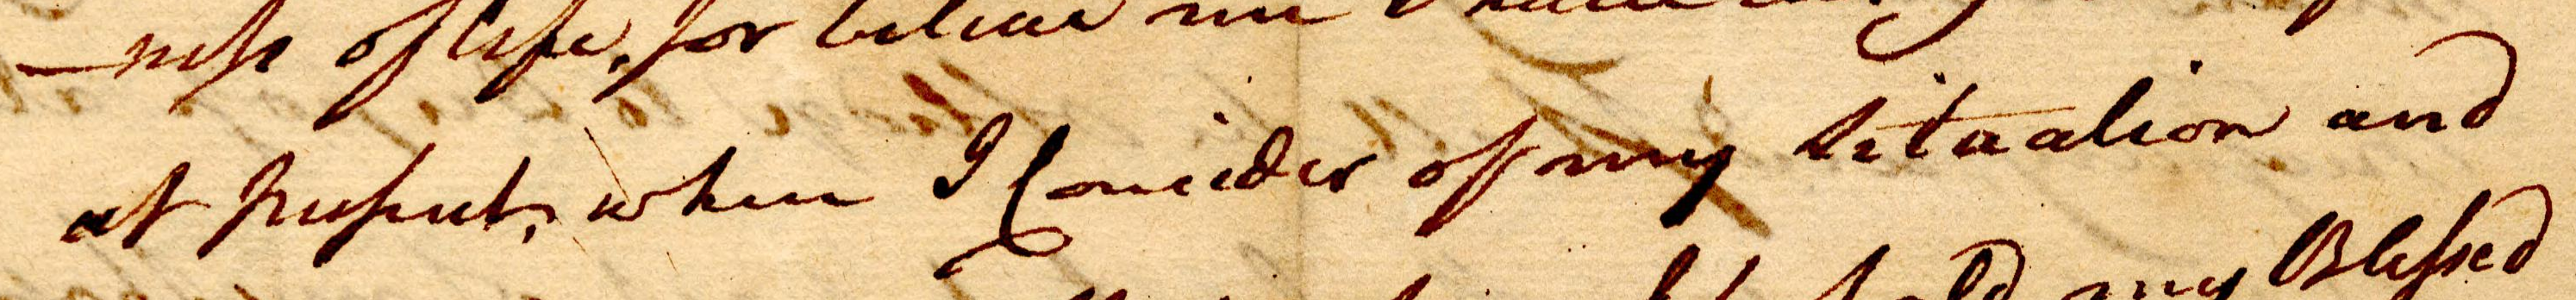at present, when I Consider of my situation and
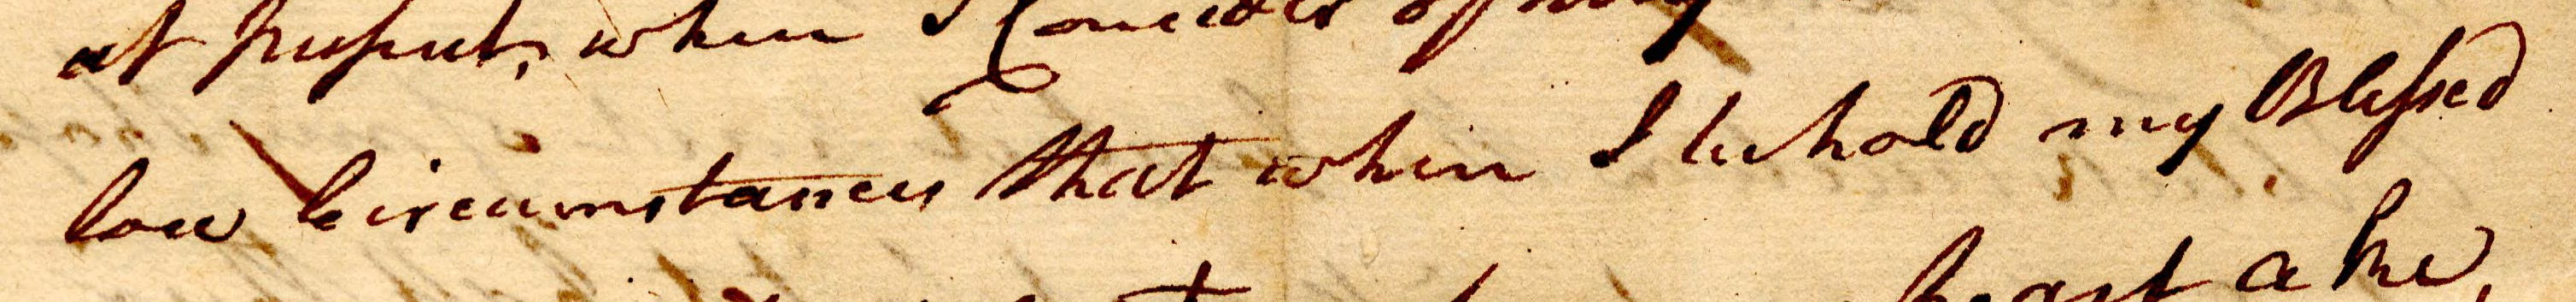low Circumstances that when I behold my Blessed
